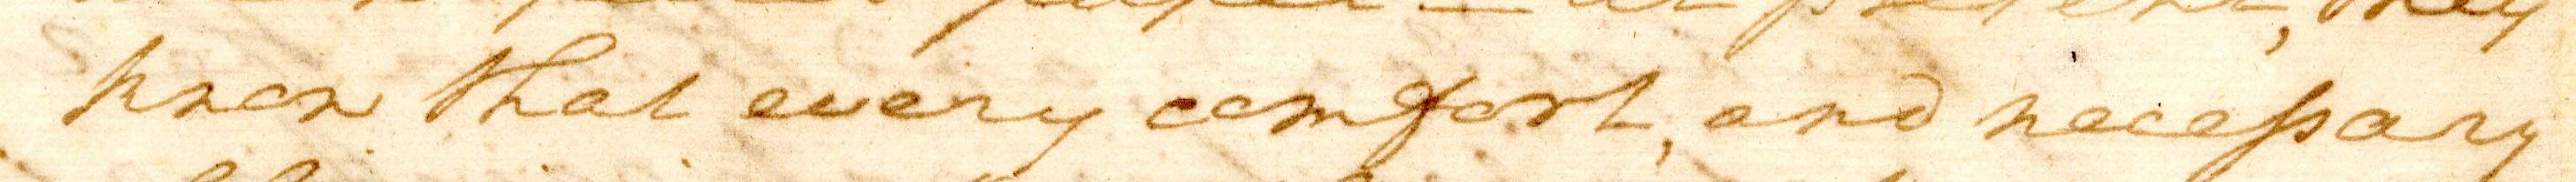know that every comfort, and necessary
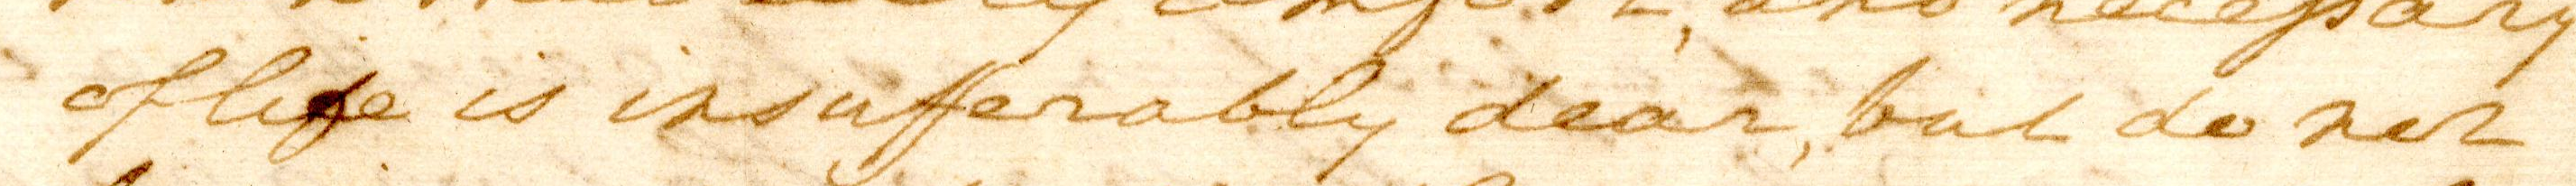of life is insufferably dear, but do not
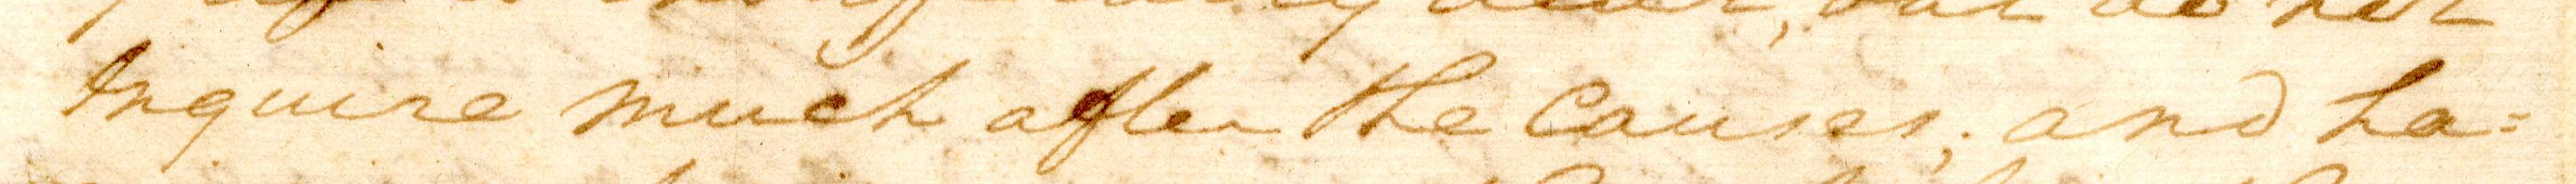Inquire much after the Causes; and ha-
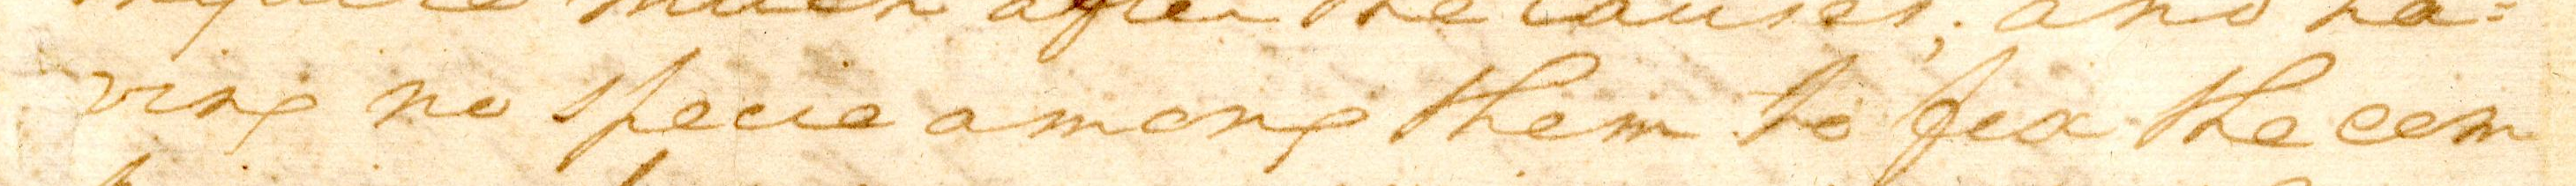-ving no specie among them to fix the com
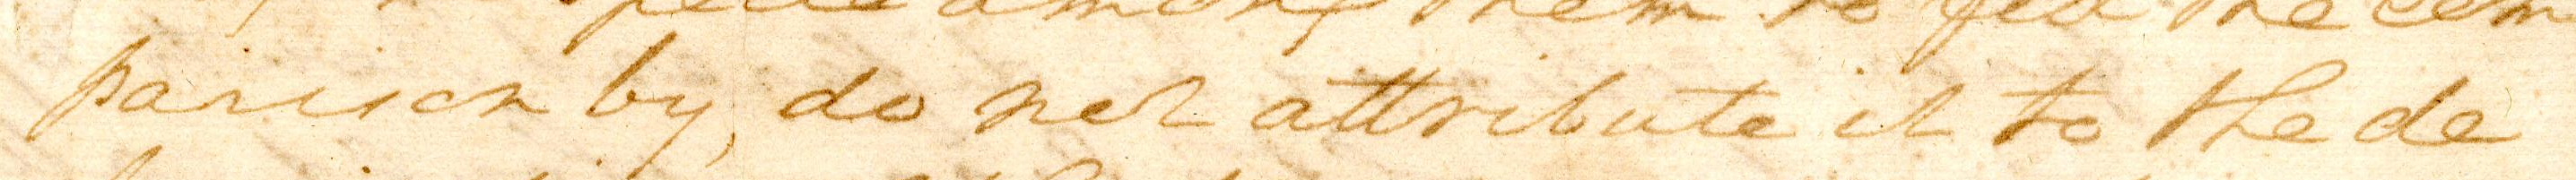parison by, do not attribute it to the de
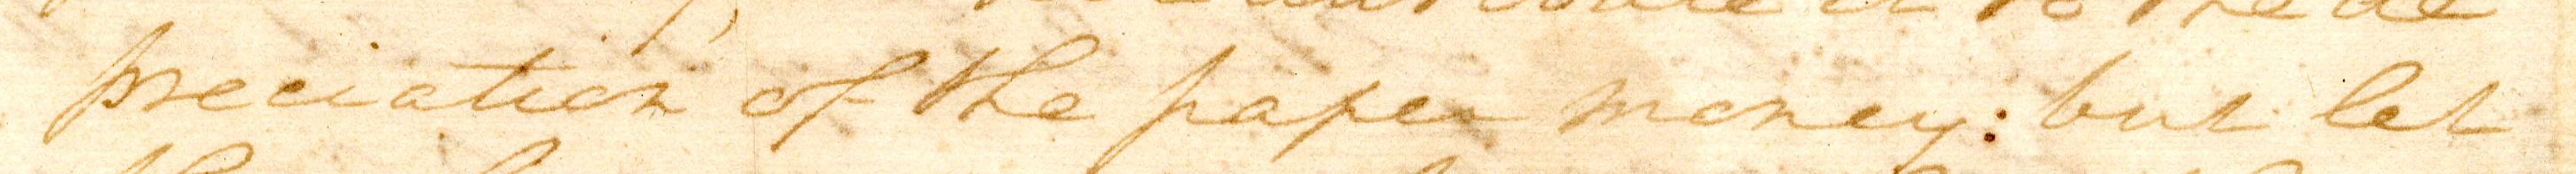preciation of the paper money: but let
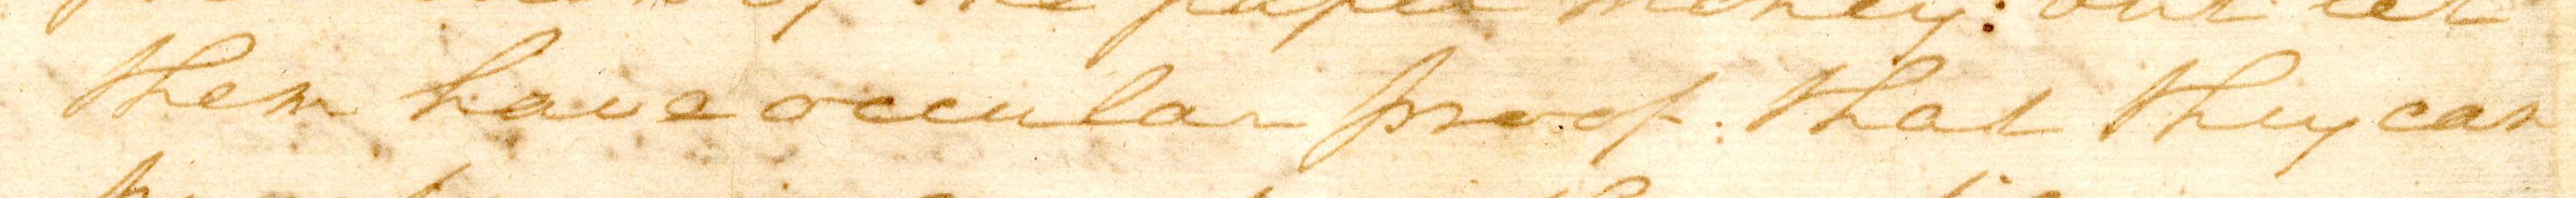them have ocular proof, that they can
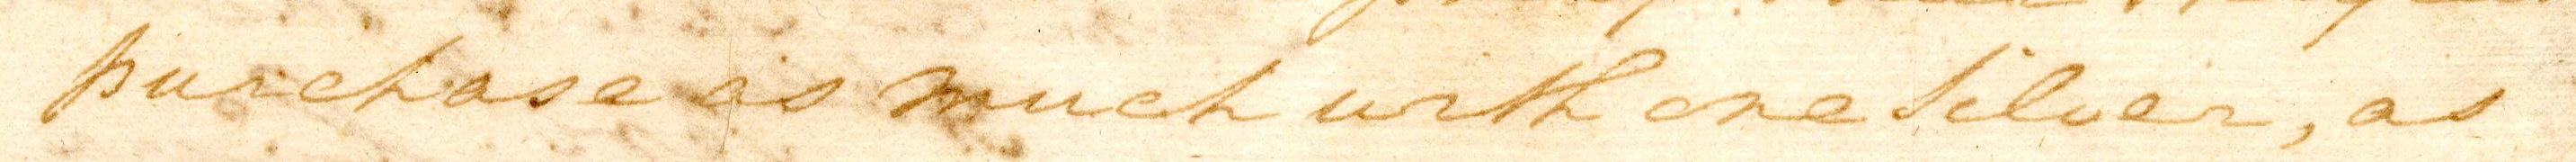purchase as much with one silver, as
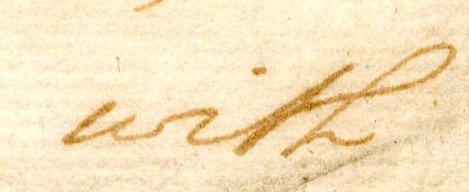with
